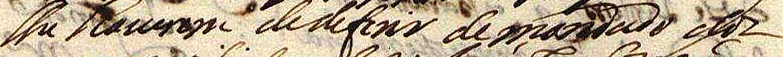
lhe hauerem de deferir de mandado doz
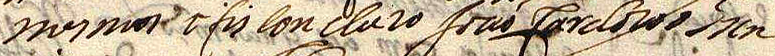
mesmos o fis concluzo Joaõ Cardozo o Escre
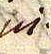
ui.
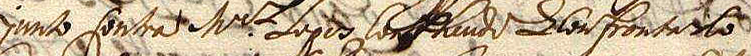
junto Contra M.el Lopes Contheudo E Confrontado
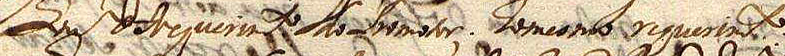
Em o Requerimto do Promotor. E o mesmo requerimto.
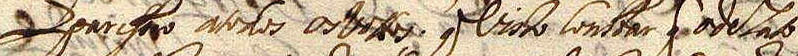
E paresseo a todos os Vottos. q̄ Visto Constar q̄ o deLato
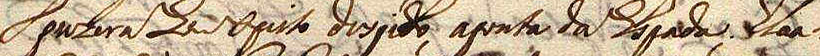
puzera Em o peito despido, a ponta da Espada, E lan
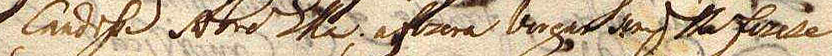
Çandosse sobre Ella; a fizera Vergar sem q̄ lhe fizese
